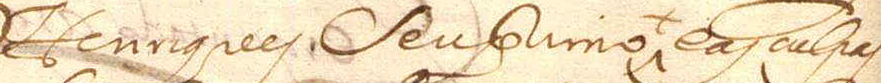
Henriques Seu primo + e as culpas
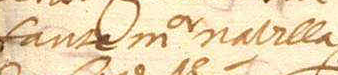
tante mor na villa
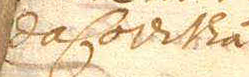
da Covilhã
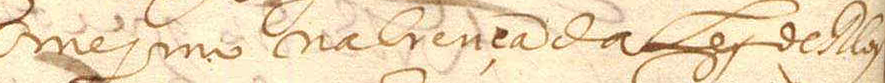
o mesmo na Crença da Ley de Moy
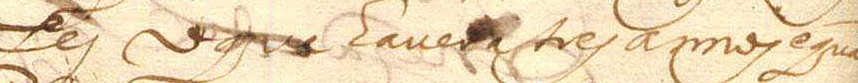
Zes o que hauera tres annos e qua
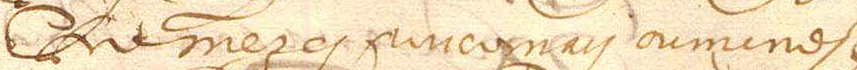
tro mezes pouco mais ou menos vin
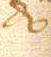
do
